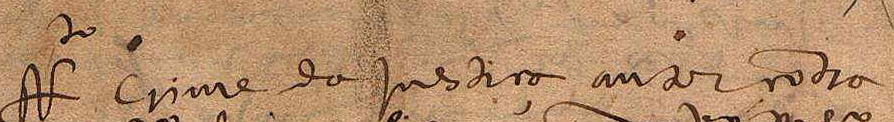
ffto crime da Justiça autor cōtra
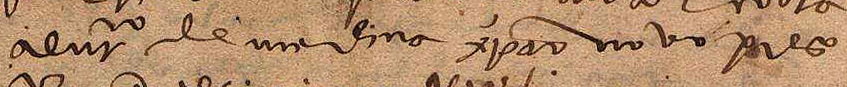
alurro de medina xpão novo preso
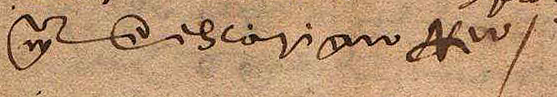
mor ē escariguo Reo /
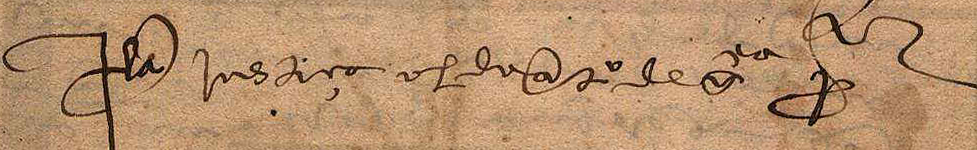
Plā Justiça o Ldo āto de gea ꝓtor
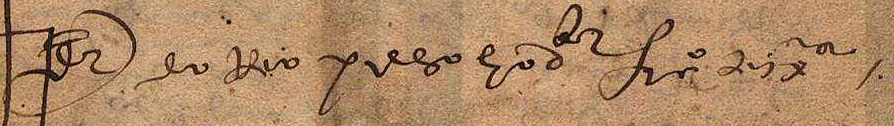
Pdōr do Reo preso ho dtor frco teixra /.
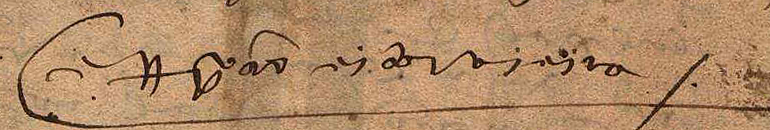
estp̄vão ejtor vjejra /.
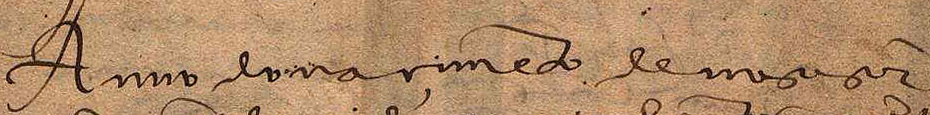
Anno do naçimēto de noso sor̄
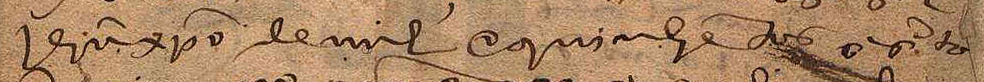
Jhū xpō de mil e quinhētos sesēta
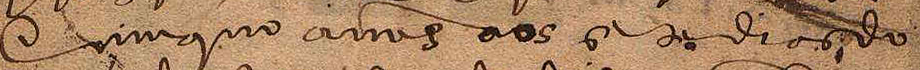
e çimquo an̄os aos sete dias do
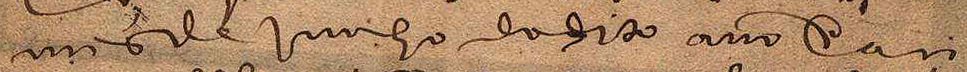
mes de Junho do dito anō ē a çi
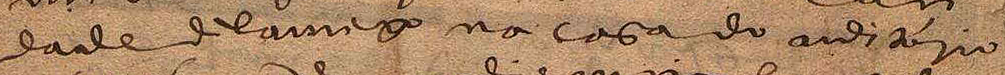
dade de lamego na casa do auditorio
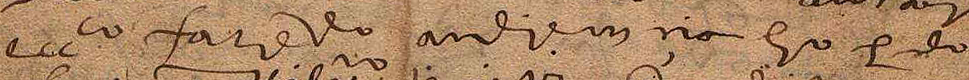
eccco fazēdo audiemçia ho Ldo
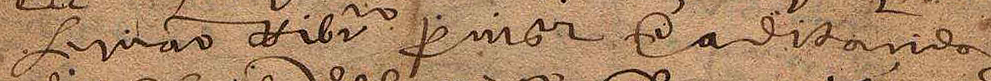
fernão Ribrro ꝓuisor ē a dita çida
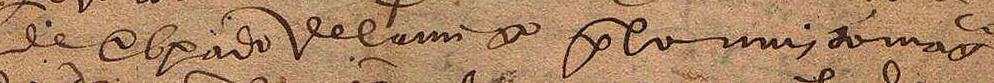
de e bpādo de lamego p̄lo mujto magco
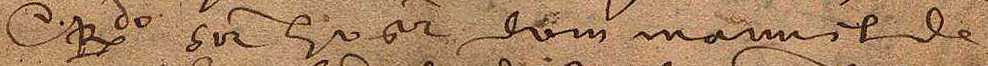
e Rdo sor̄ ho sor̄ dom manuel de
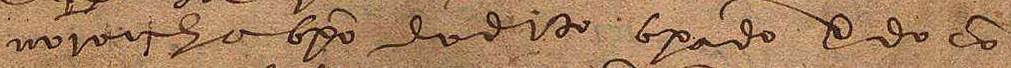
noronha bpō do dito bpad̄o e do cō
